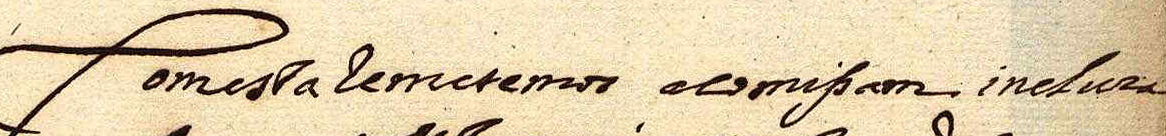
Com esta Remetemos a comissam incluza
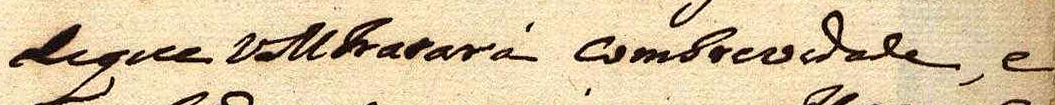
de que v M tratará com brevidade, e
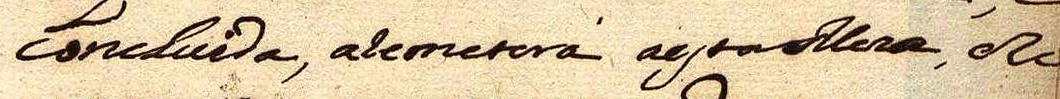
concluida, a remetera a esta Meza, e Re
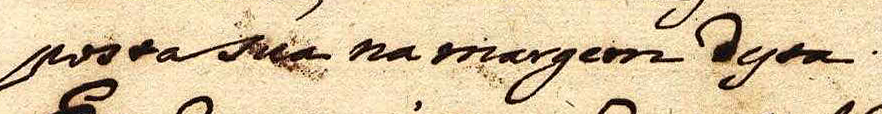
posta sua na margem desta.
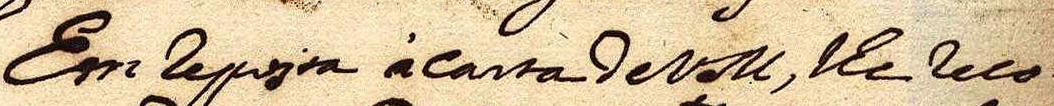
Em Reposta á carta de V M, lhe Reco
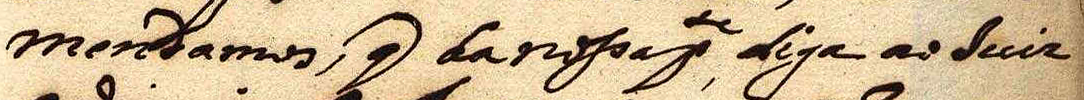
mendamos, q̄ da nossa pte, diga ao Iuiz
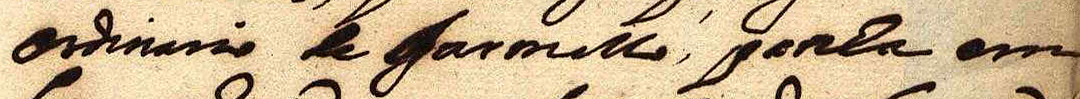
ordinario de Jarmello, ponha em
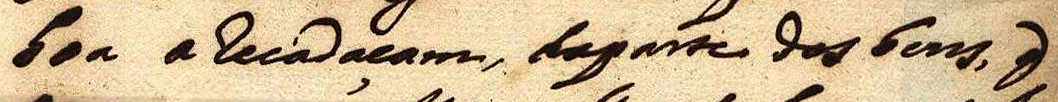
boa aRecadaçam, da parte dos bens, q̄
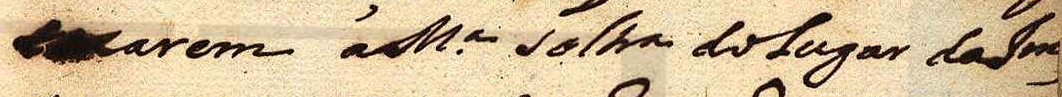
t_arem a M.a soltra do Lugar da Im_
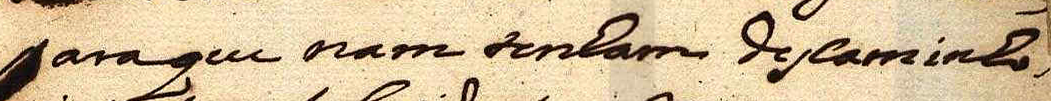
para que nam tenham descaminho,
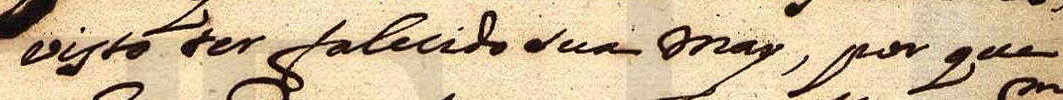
visto ter falecido sua may, por que
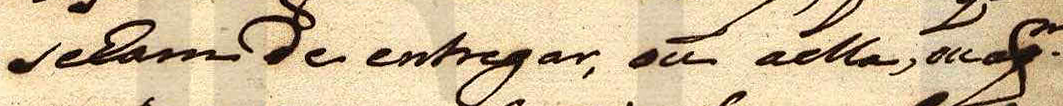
se ham de entregar, ou a ella, ou a q.m
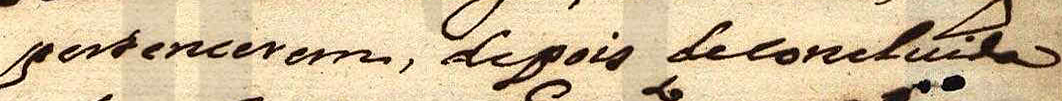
pertencerem, depois de concluida
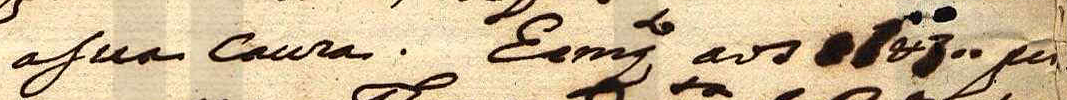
a sua cauza. E emqto aos _$300 per
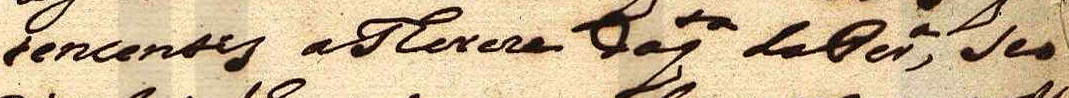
tencentes a Thereza da q.ta da Pera, se o
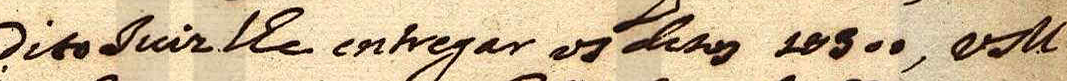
dito Iuiz lhe entregar os ditos 1$300, V M.
